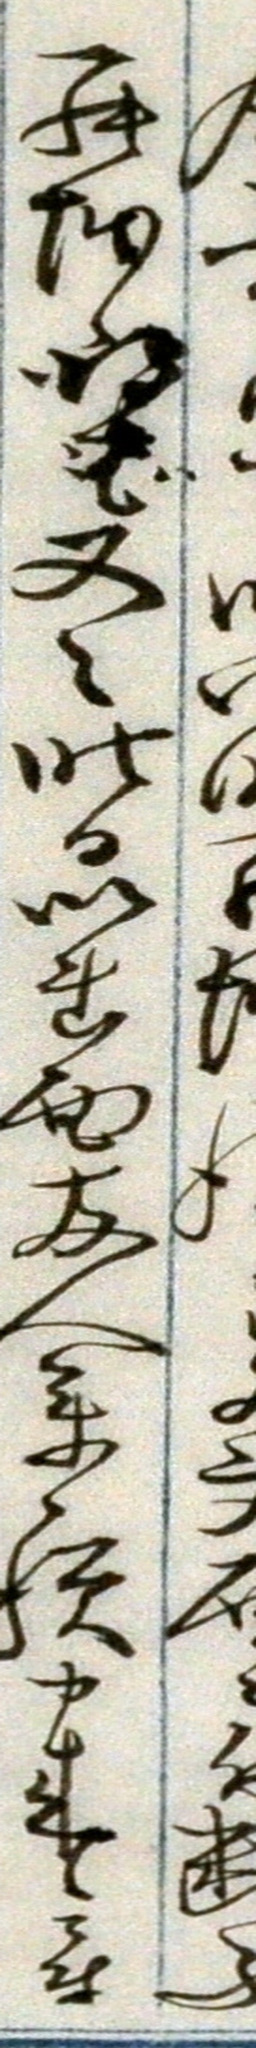罷越候得者又々昨日以書面両人参候様申来候ニ付
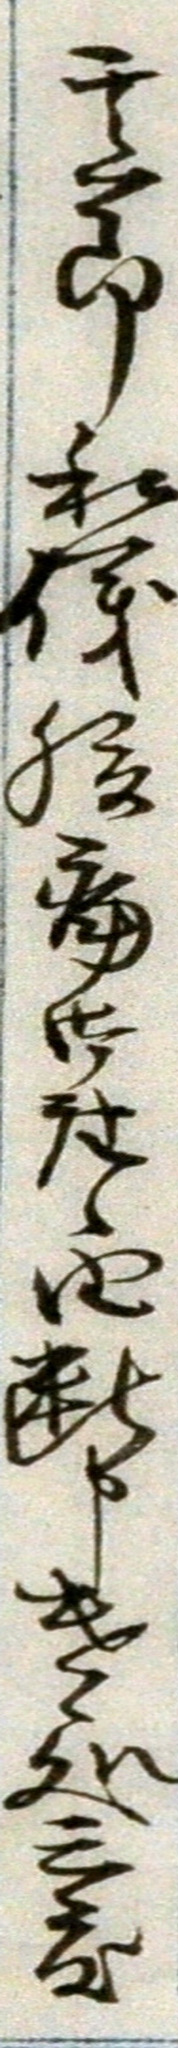其節私儀腹痛御座候由断申遣候処三度
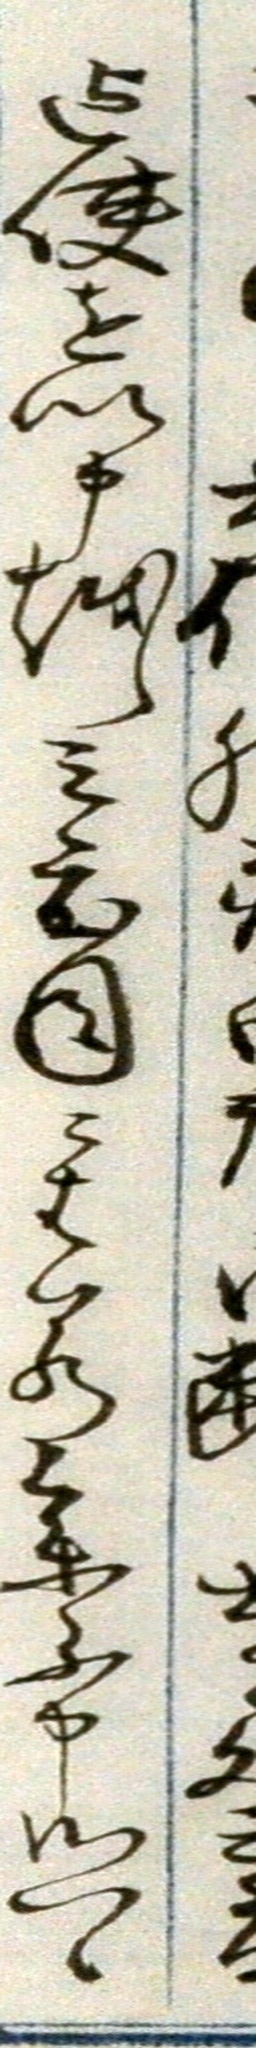迄使を以申越候三度目ニ者若参不申候ハヽ
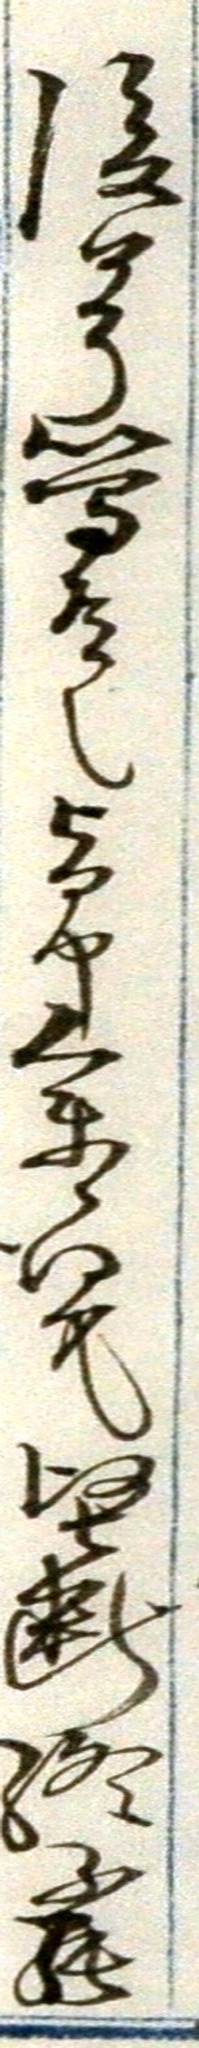後日了簡有之旨申参候得共堅断終不罷

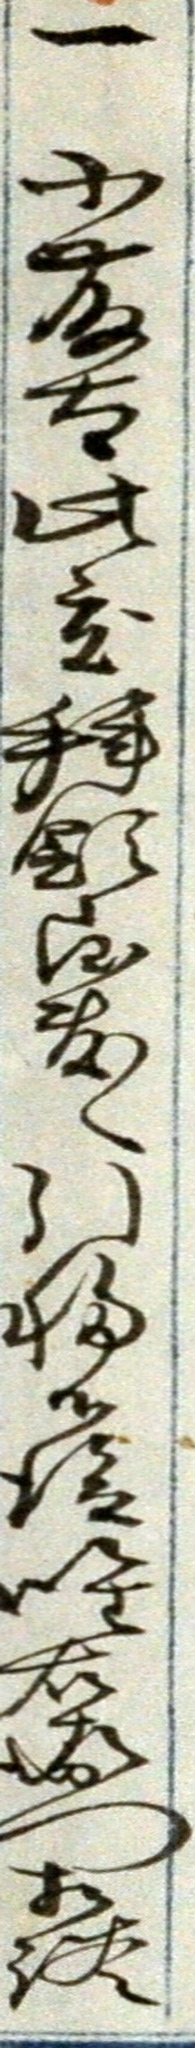一小藤太此度拝領屋敷へ引移候後唯右衛門相談
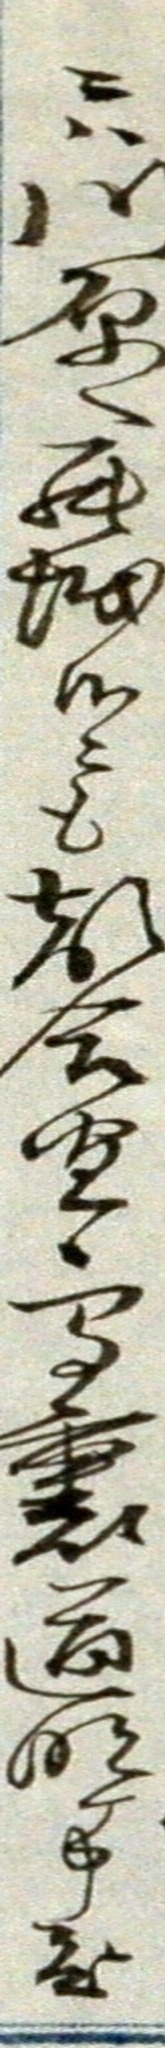ニハ川原へ罷越候ニも都合宜候間裏道明ヶ申度
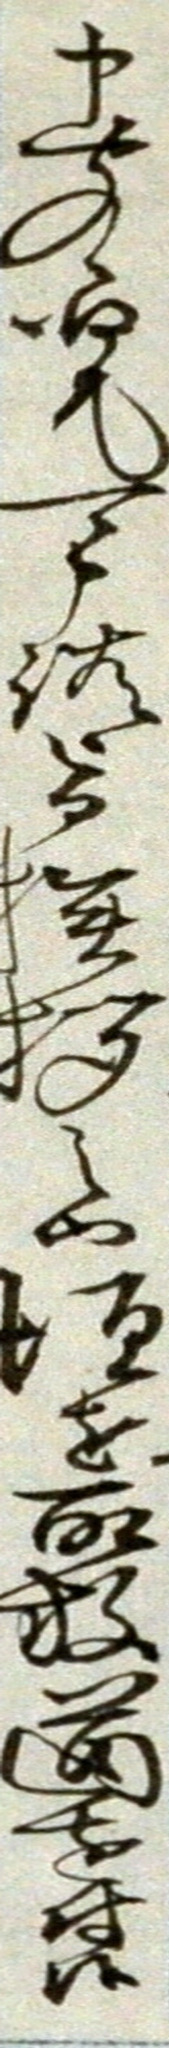申聞候得共可申談旨挨拶之内垣を取放道を付候
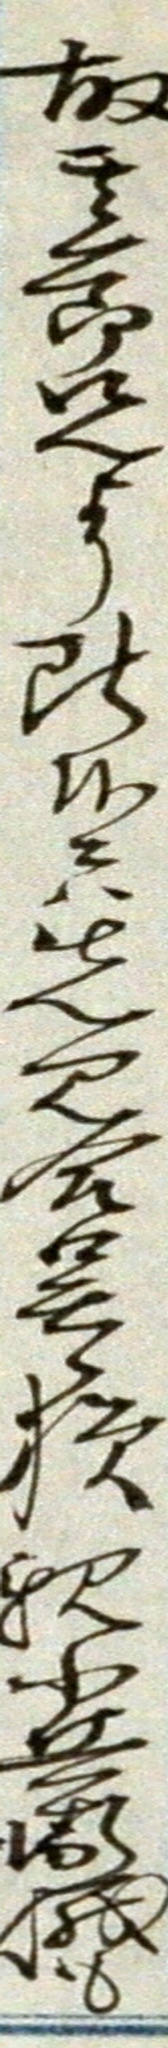故其節兄より断候ニハ先見合呉候様親小兵衛儀も
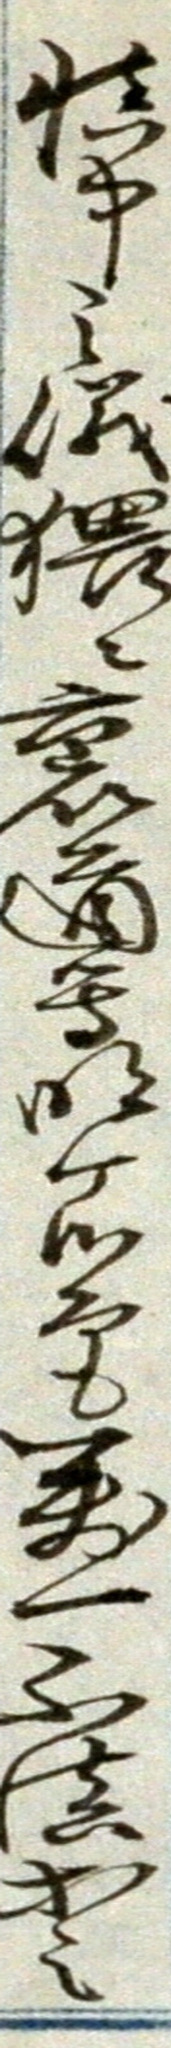慎中之儀猥ニ裏通等明ヶ候而も万一不慎抔之
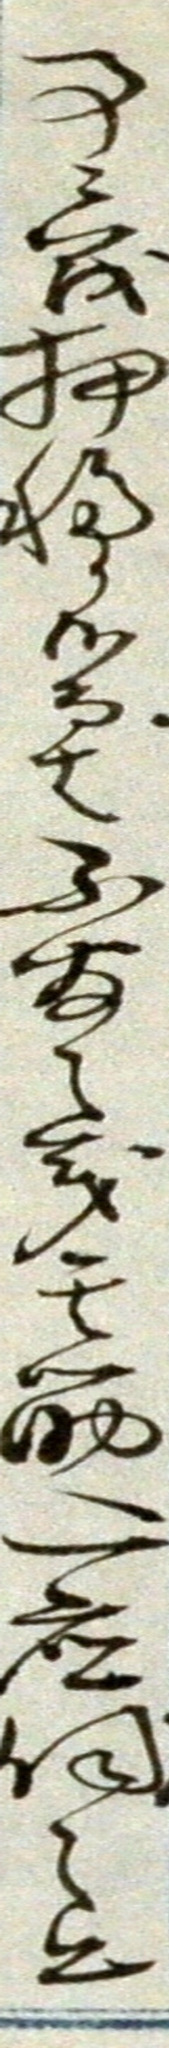事ニ茂押移り候而者不宜之義其筋へ一応伺之上
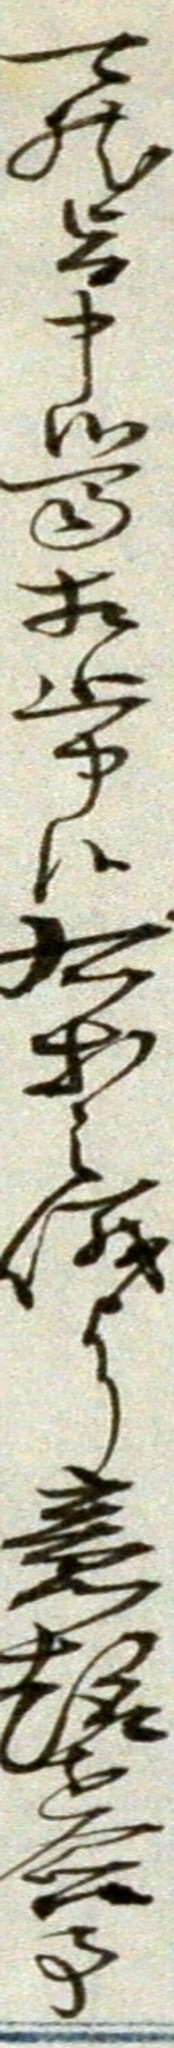可然旨申候間相止申候右抔之儀より意趣を含事
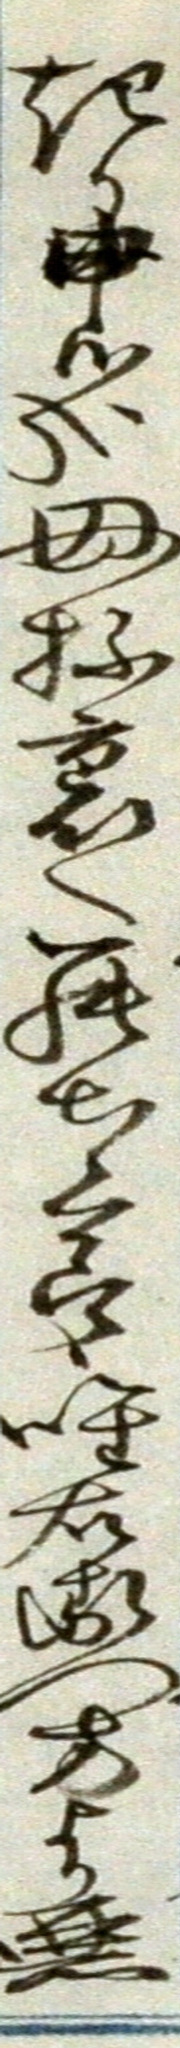起り申候哉母抔裏へ罷出候節唯右衛門方より悪
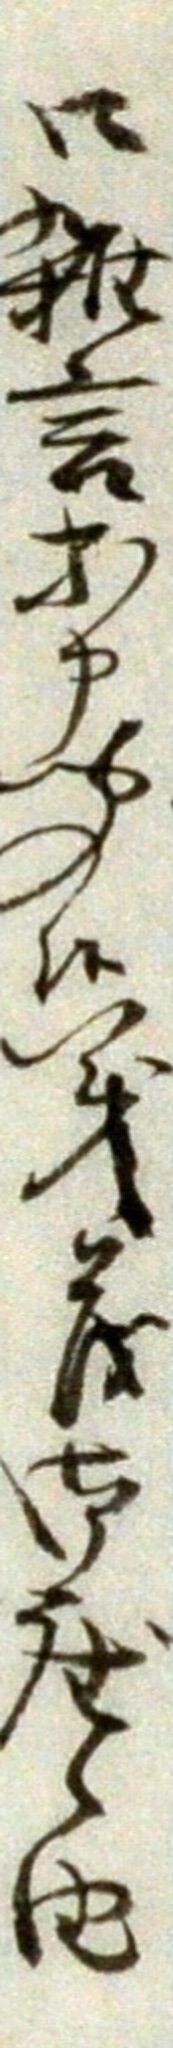口雑言等申聞候義茂御座候由
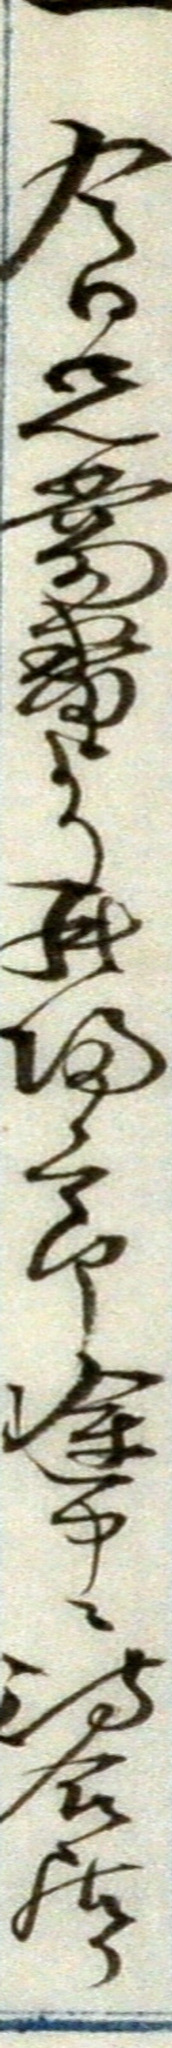一今日兄當番より罷帰候節途中ニ待合居り
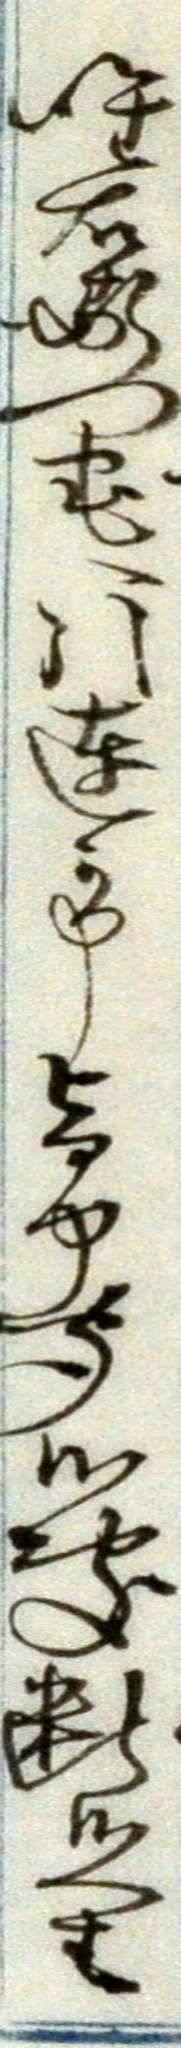唯右衛門宅へ引連可申旨申聞候處断候へ者
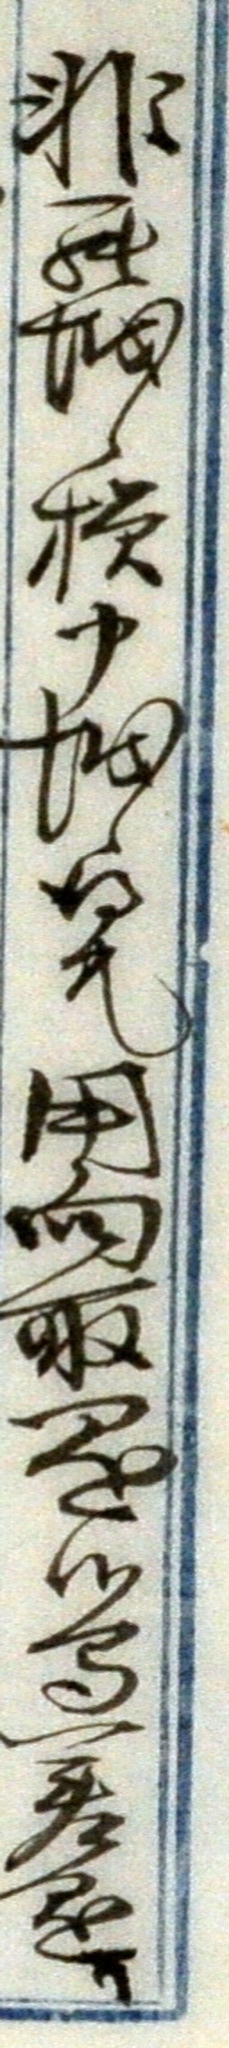非罷越候様申越候得共用向取懸候間差懸り
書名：川面小藤太子細有之多賀谷唯右衛門ヲ打果候一件
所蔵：伊那市立高遠町図書館・合同会社AMANE
